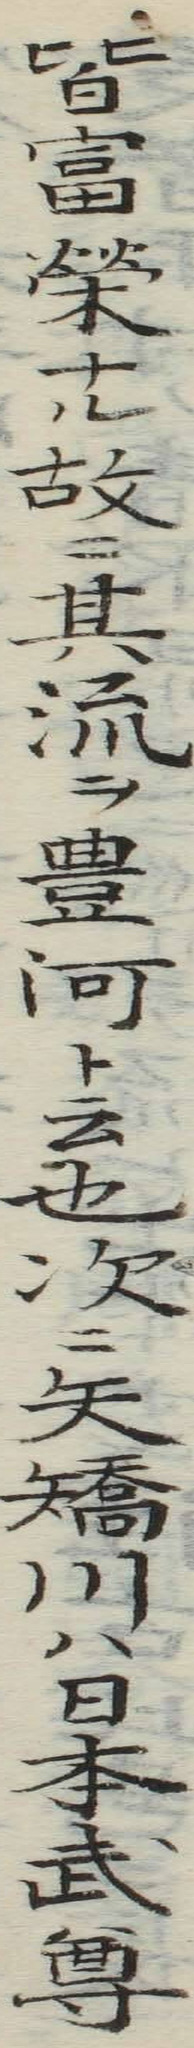皆富榮ナル故ニ其流ヲ豊河ト云也次ニ矢矯川ハ日本武尊
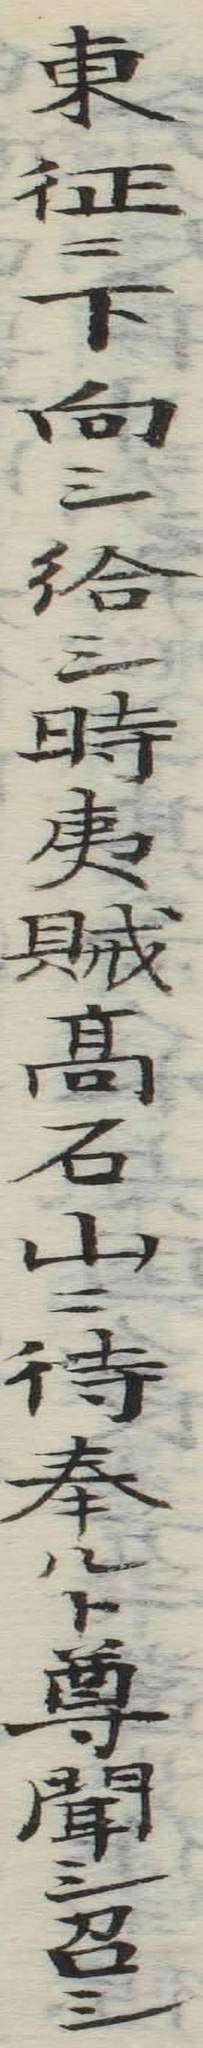東征ニ下向シ給シ時夷賊髙石山ニ待奉ル尊聞シ召シ
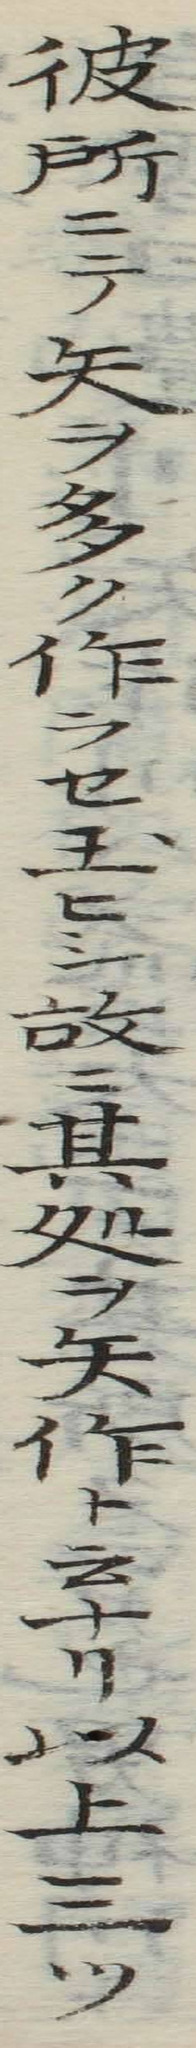彼所ニテ矢ヲ多ク作ラセ玉ヒシ故ニ其処ヲ矢作ト云ナリ以上三ツ
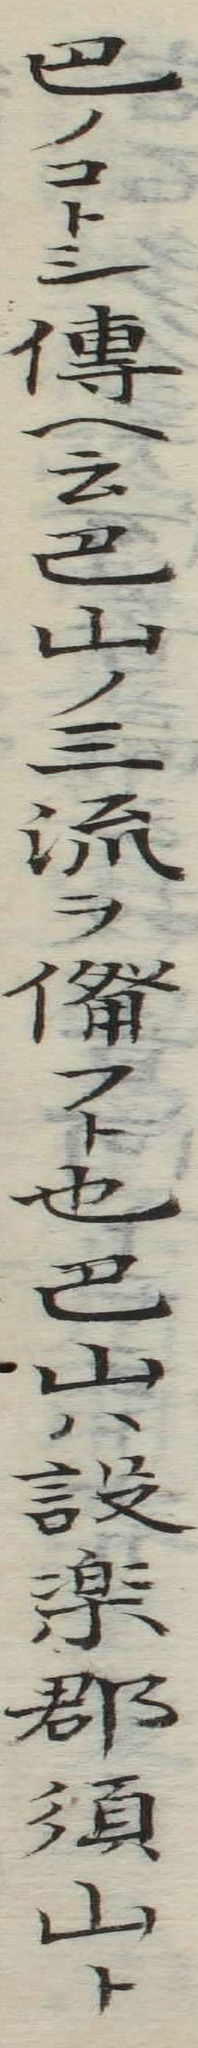巴ノコトシ傳ヘ云巴山ノ三流ヲフト也巴山ハ設楽郡須山ト
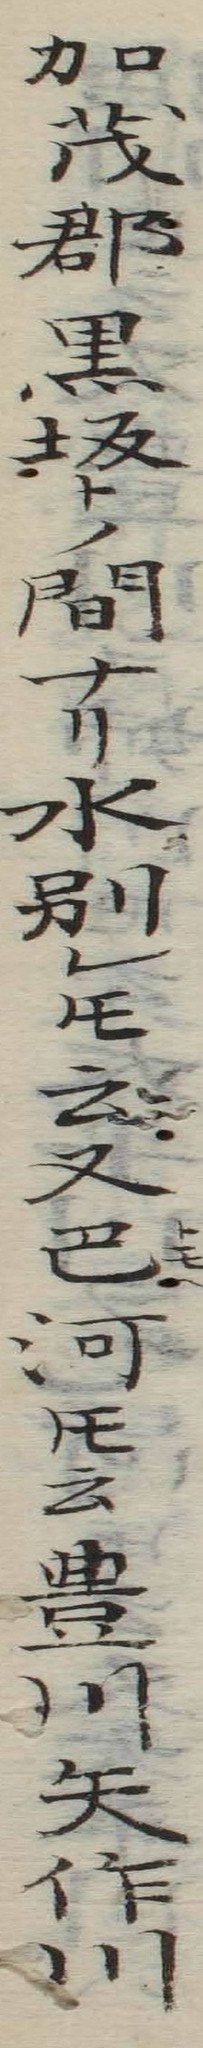加茂郡黒坂トノ間ナリ水別レトモ云又巴河トモ云豊川矢作川

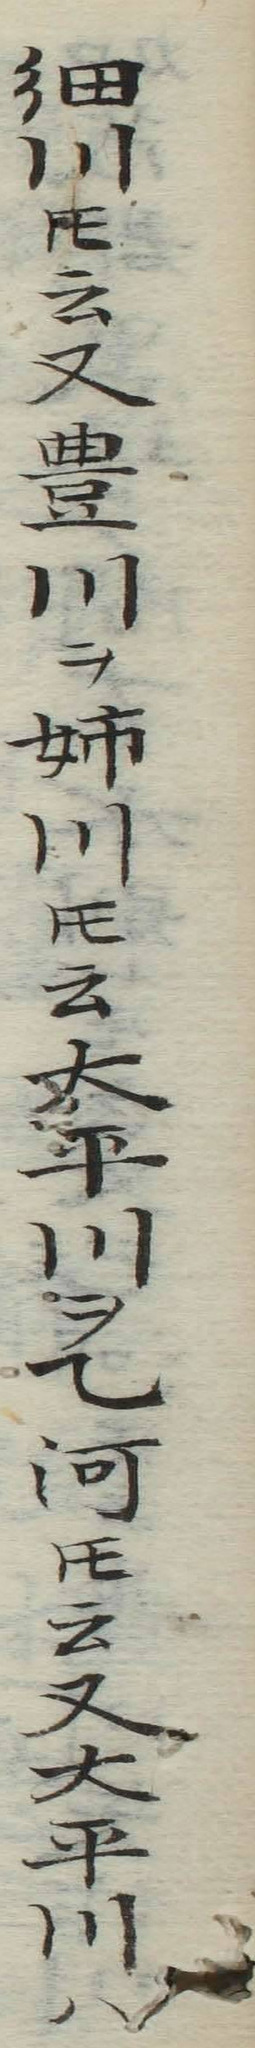細川トモ云又豊川ヲ姉川トモ云大平川ヲ乙河トモ云又大平川ハ
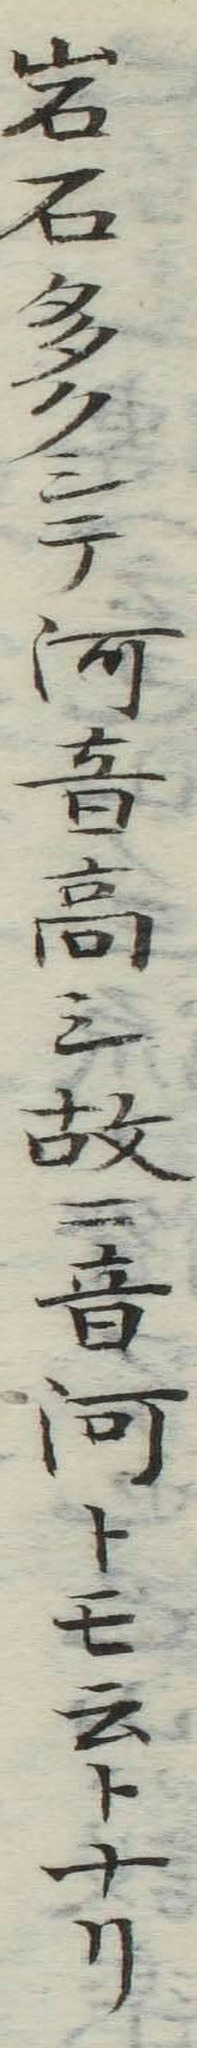岩石多クシテ河音高シ故ニ音河トモ云トナリ
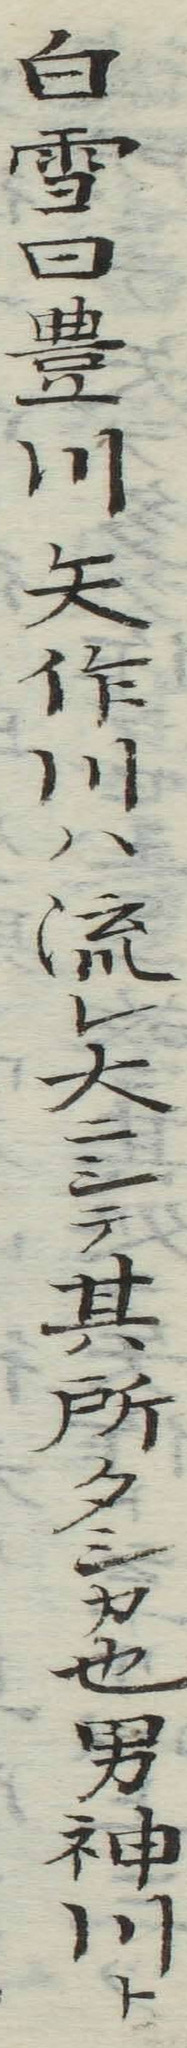白雪曰豊川矢作川ハ流レ大ニシテ其所タシカ也男神川ト
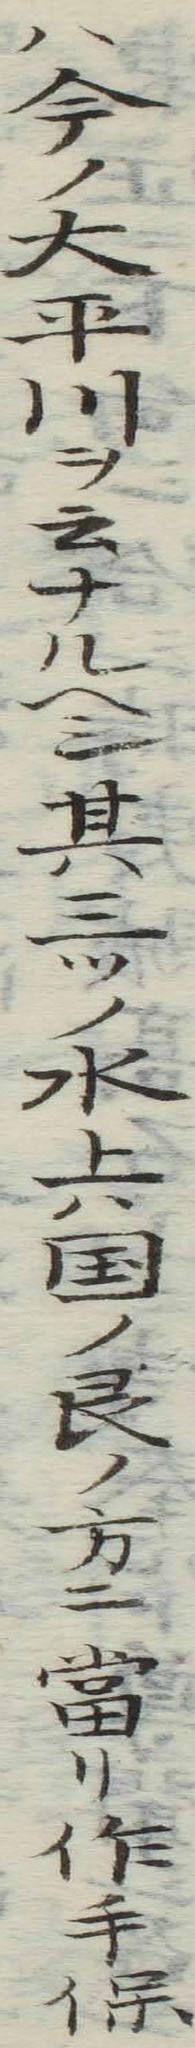ハ今ノ大平川ヲ云ナルヘシ其三ツノ水上ハ国ノ艮ノ方ニ當リ作手保
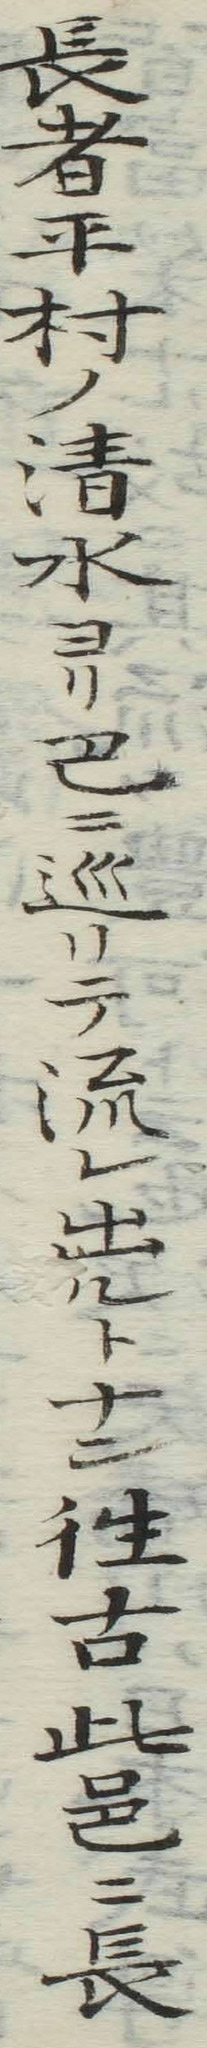長者平村の清水ヨリ巴ニ巡リテ流レ出ルトナン往古此邑ニ長
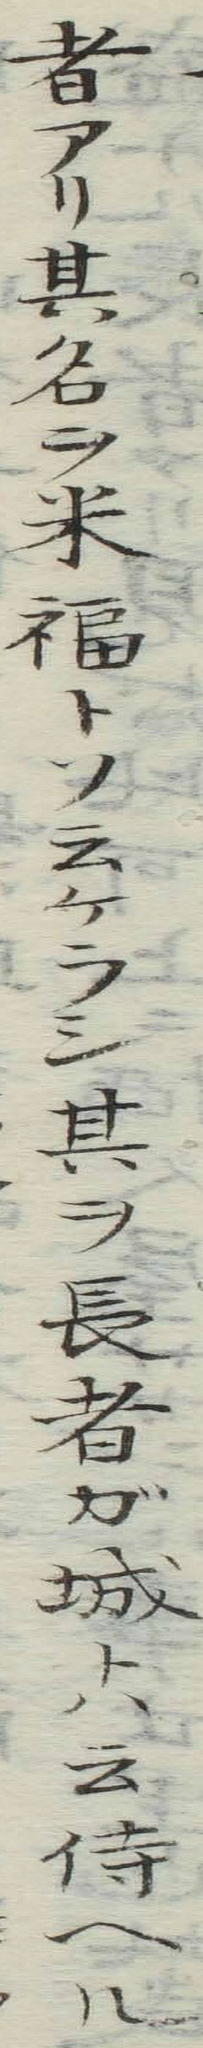者アリ其名ヲ米福トソ云ケラシ其ヲ長者ガ城トハ云侍ヘル
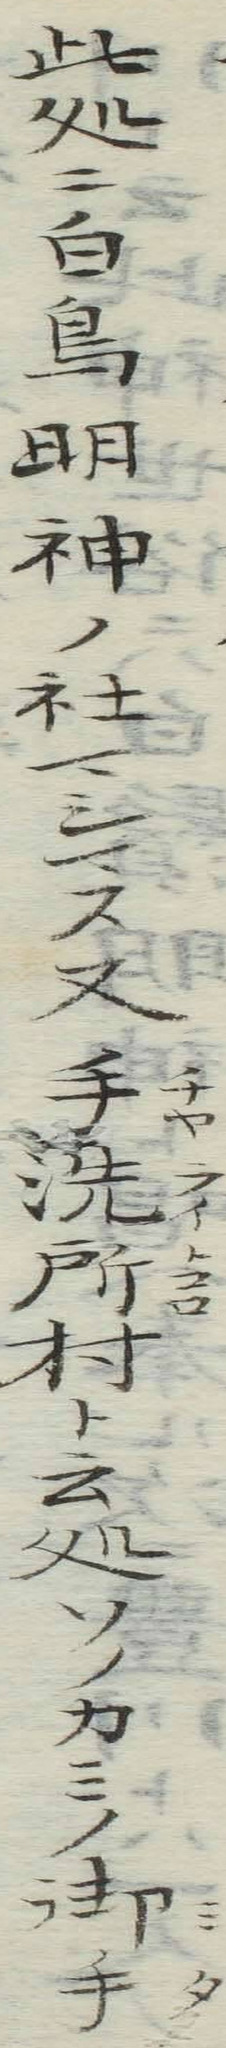此処ニ白鳥明神ノ社マシマス又手洗所村ト云処ソノカミノ御手
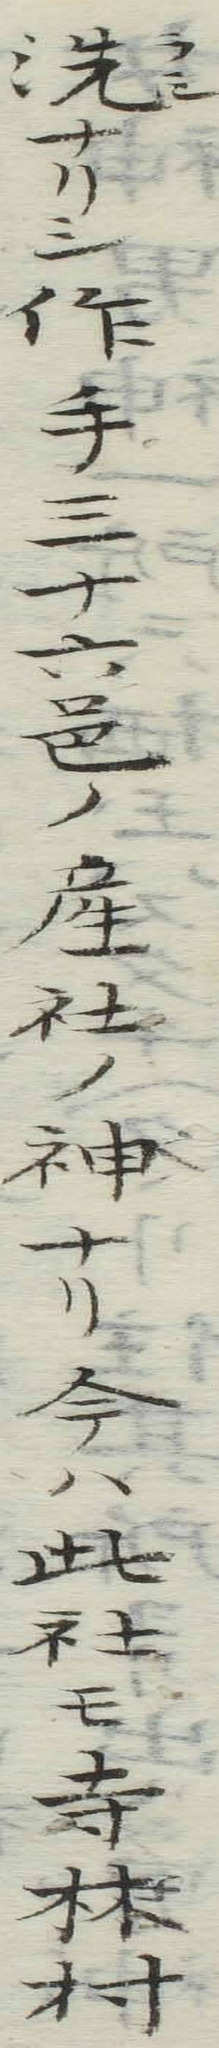洗ナリシ作手三十六邑ノ産社ノ神ナリ今ハ此社モ寺林村
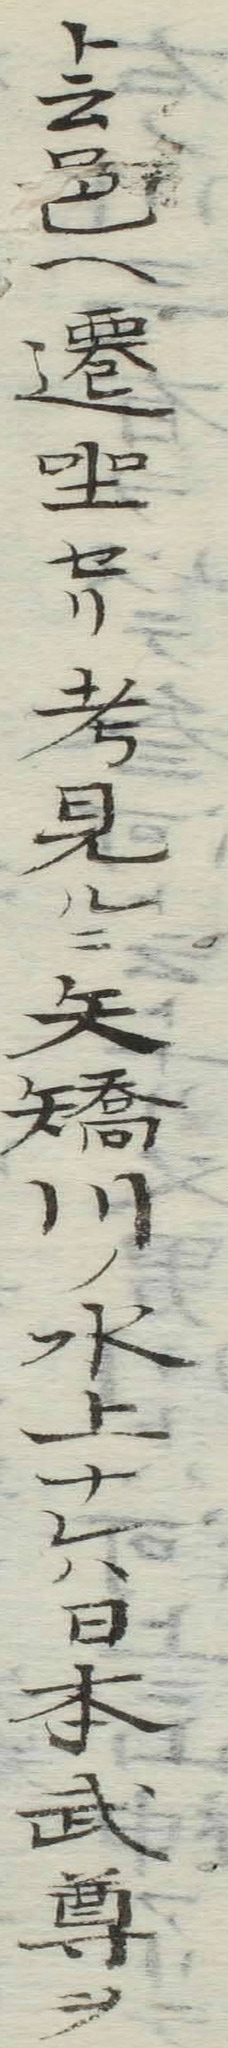ト云邑ヘ遷坐セリ考見ルニ矢矯川ノ水上ナレハ日本武尊ヲ
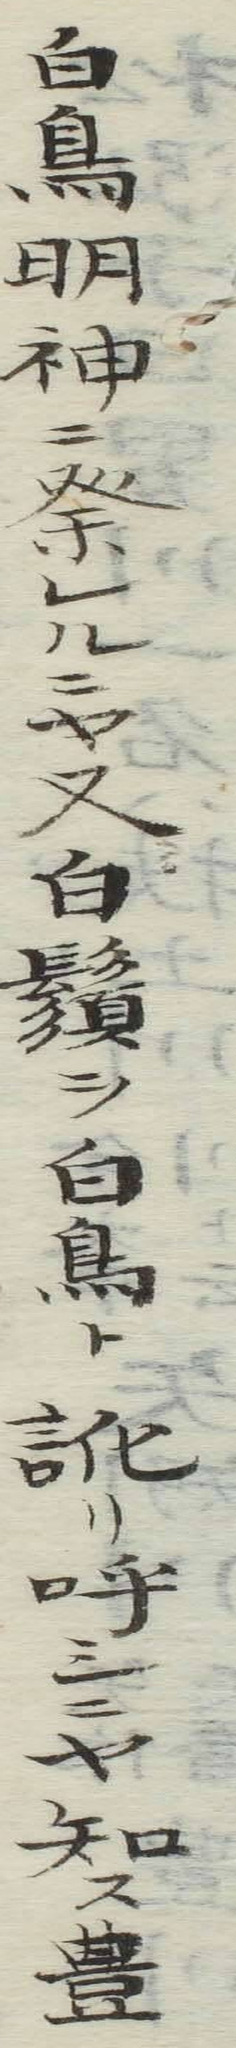白鳥明神ニ祭レルニヤ又白鬚ヲ白鳥ト訛リ呼シニヤ知ス豊
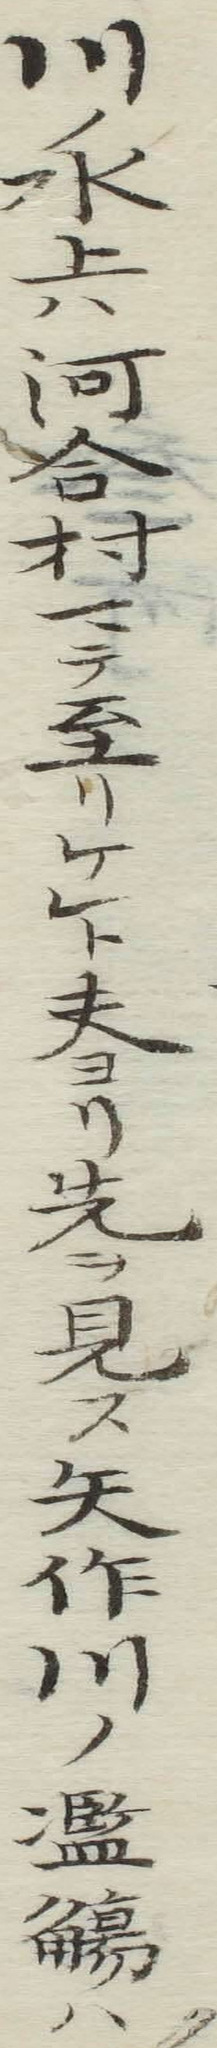川ノ水上ハ河合村マテ至リケレト夫ヨリ先ヲ見ス矢作川ノ濫觴ハ
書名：三河国二葉松
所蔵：国文学研究資料館
